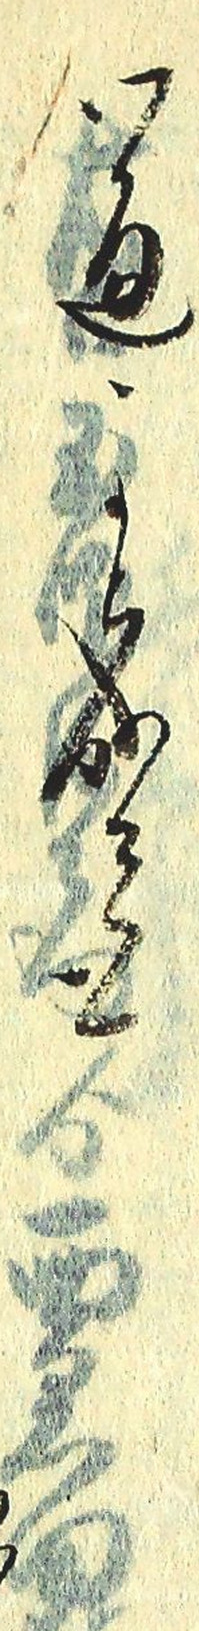御通可被成候以上
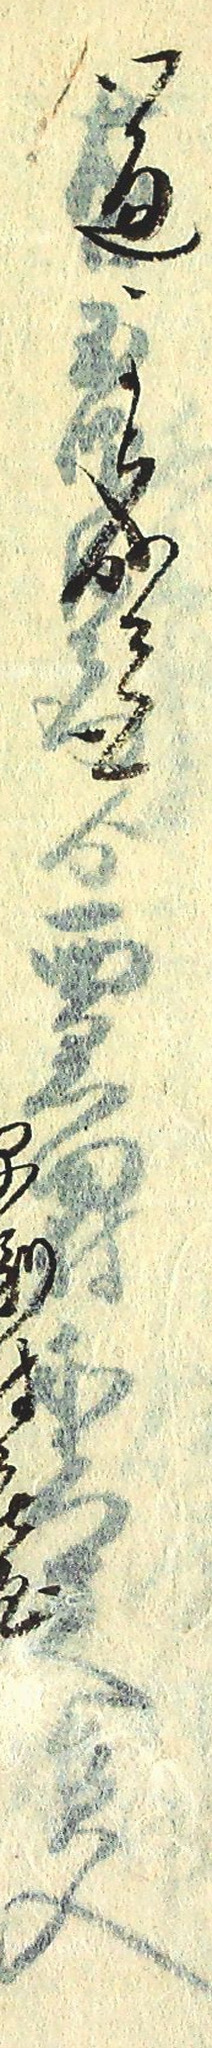御通可被成候以上
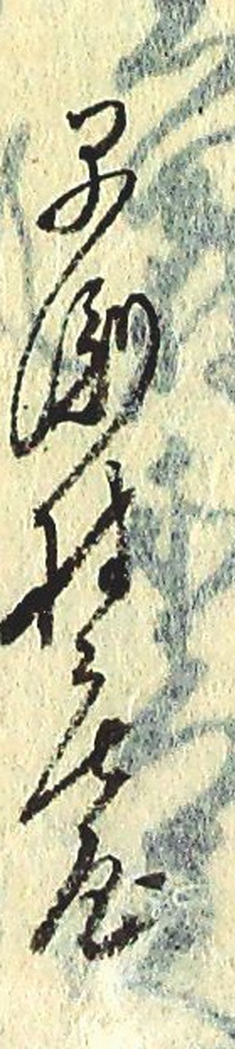早淵村庄屋
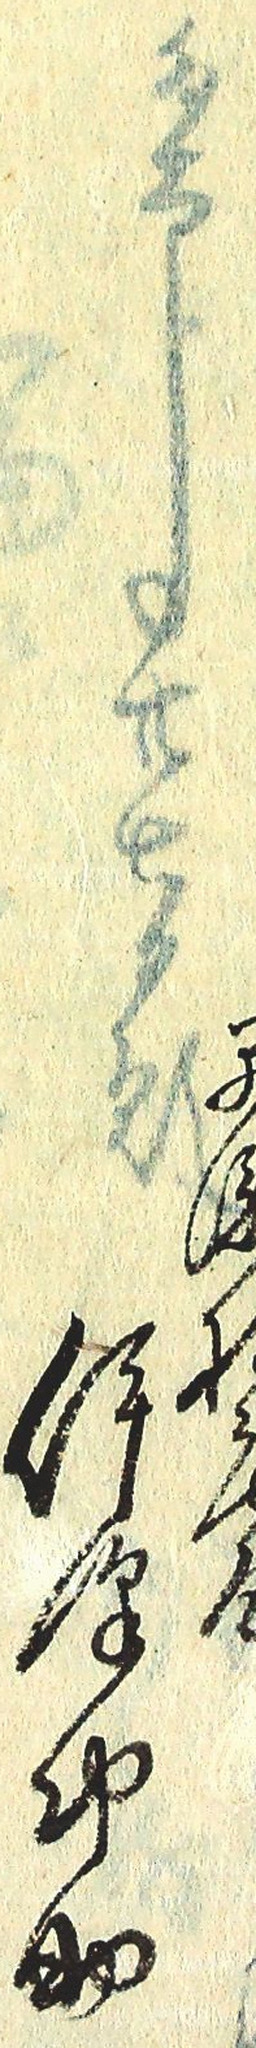伊沢仲助
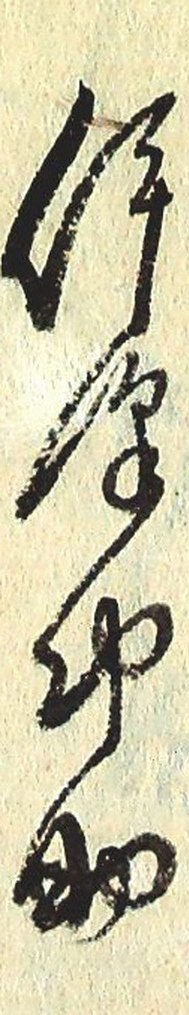伊沢仲助
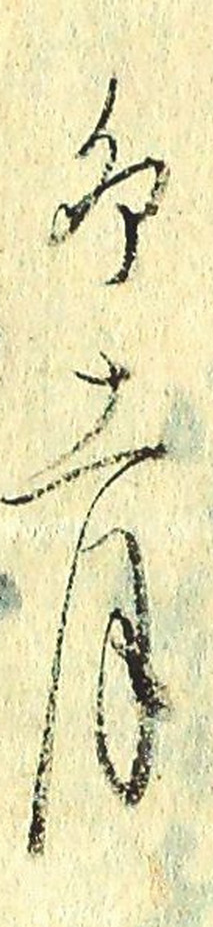卯十一月
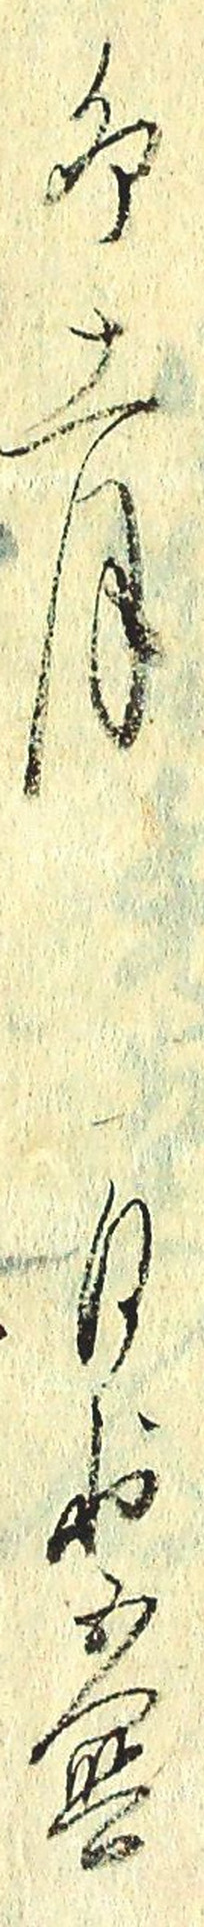卯十一月同村五人与
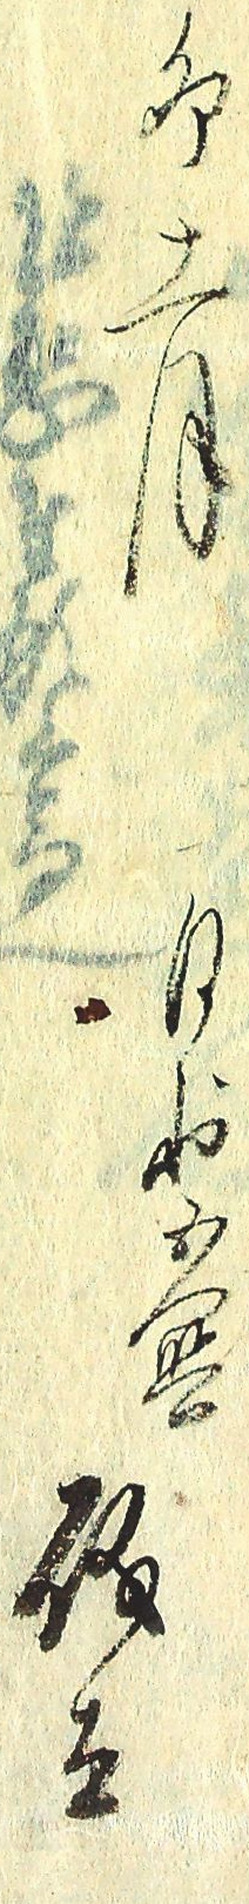卯十一月同村五人与
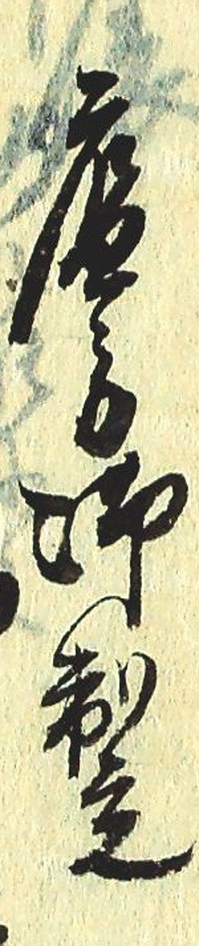藍方御制道
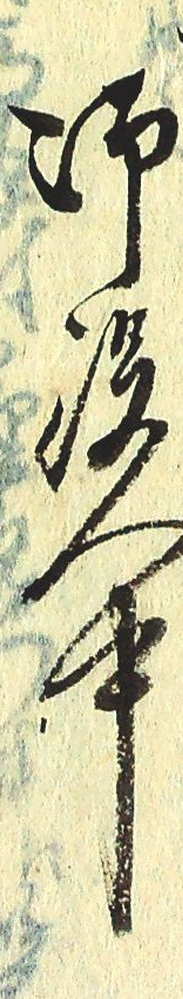御役人中
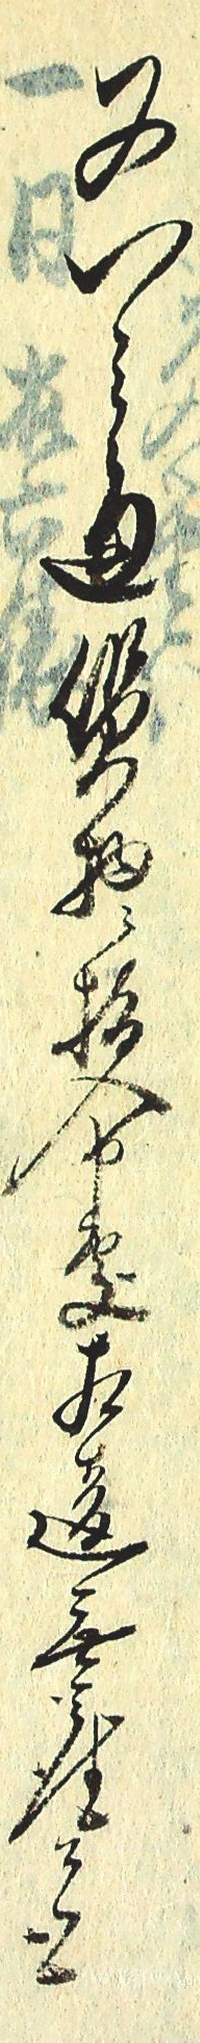右之通質物に指入申処相違無御座候以上
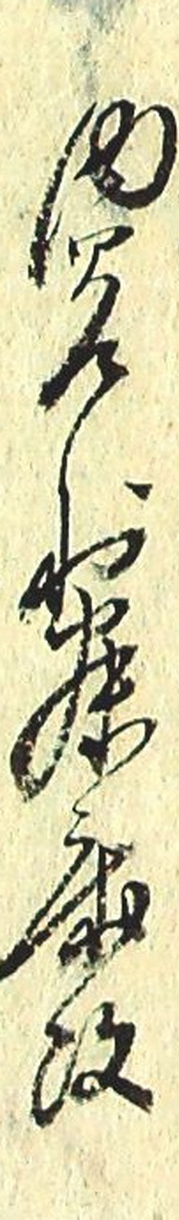内谷村寐床改
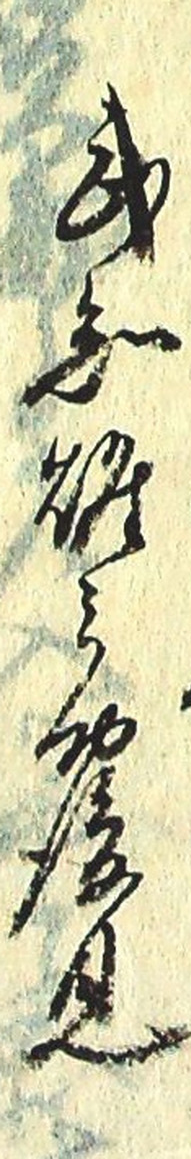武知雄之助後見
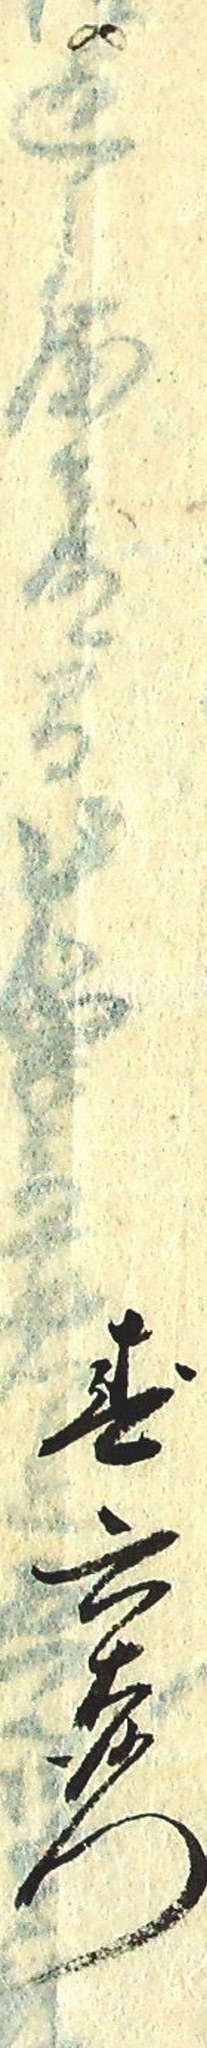盛六右衛門
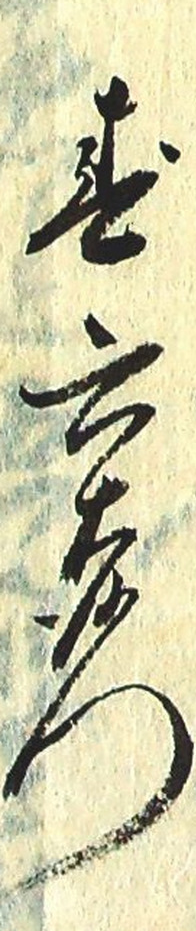盛六右衛門
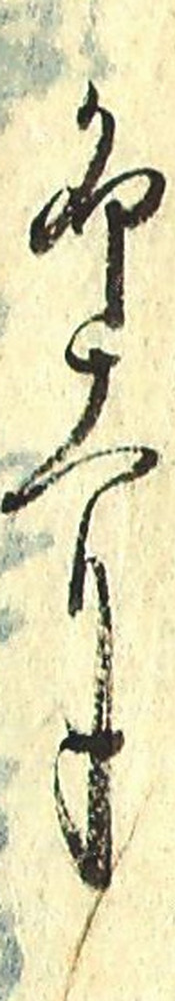卯十一月
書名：諸御願書控(弐番）
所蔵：鳴門教育大学 Naruto University of Education
